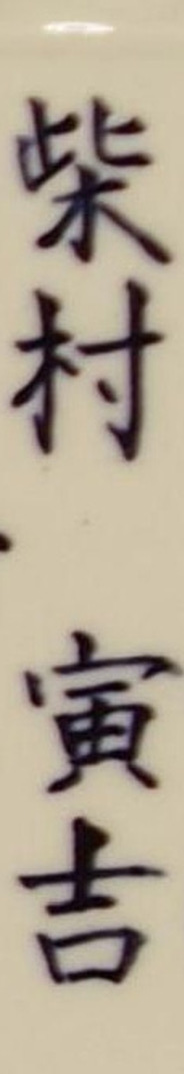柴村寅吉
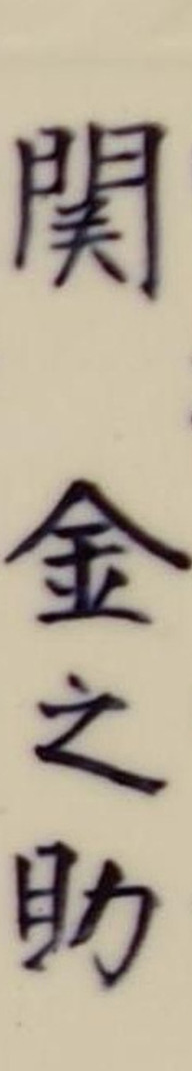関金之助
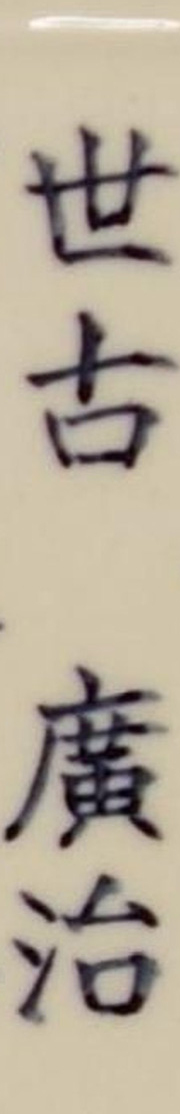世古廣治
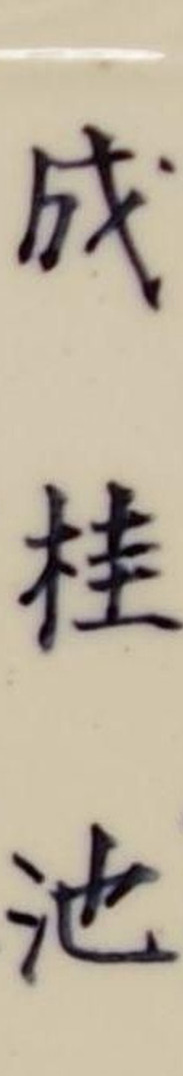成桂池
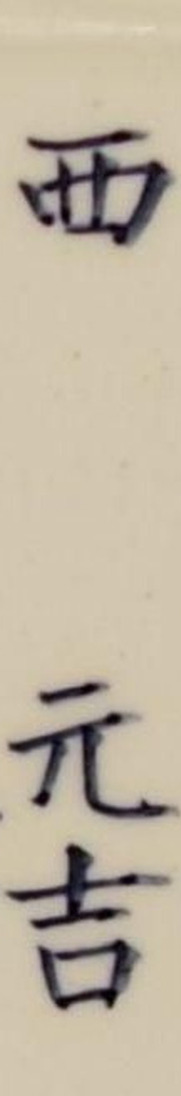西元吉
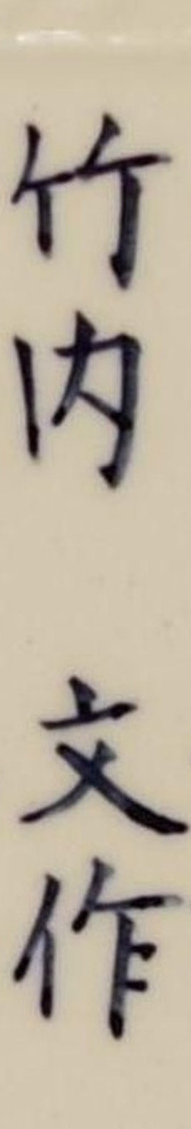竹内文作
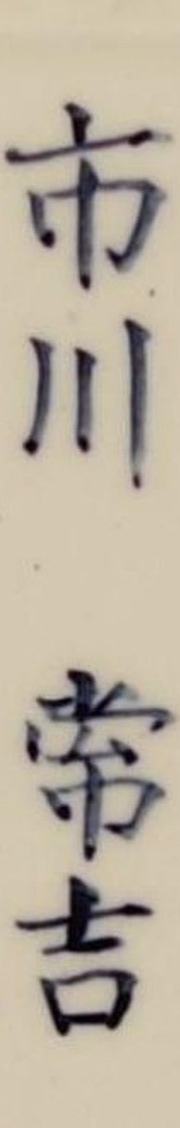市川常吉
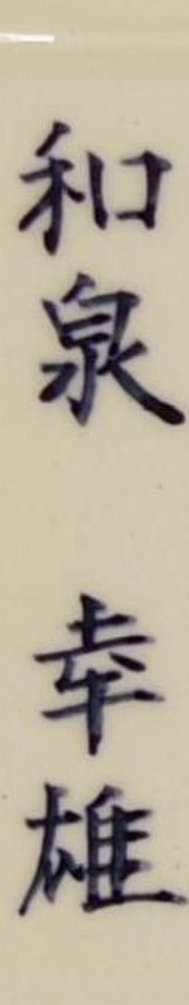和泉幸雄
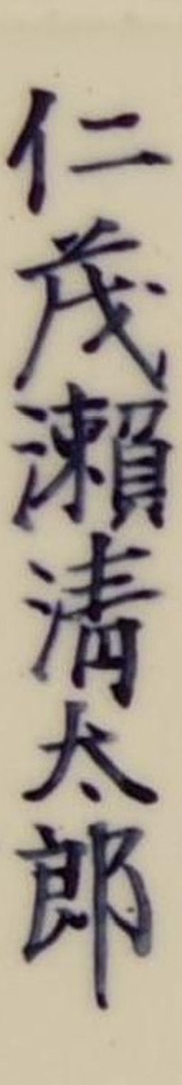仁茂瀬清太郎
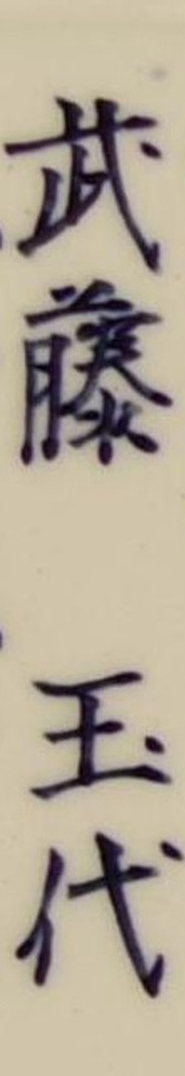武藤玉代
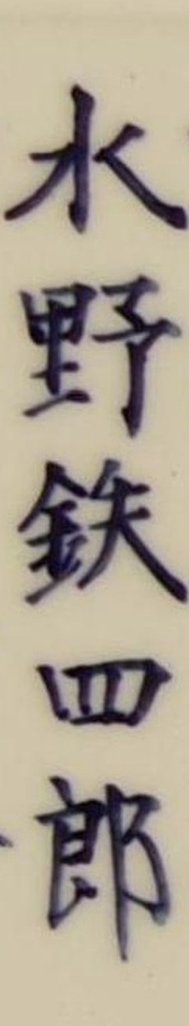水野鉄四郎
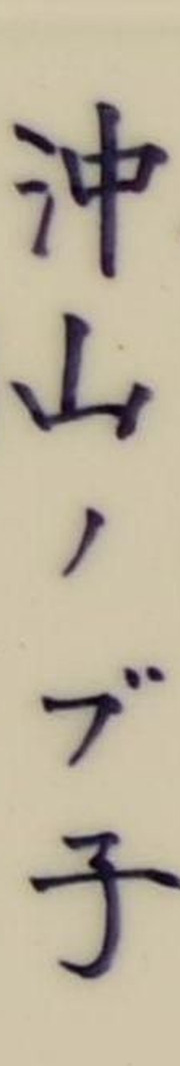沖山ノブ子
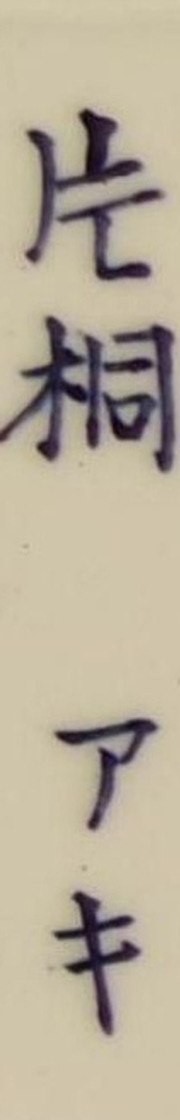片桐アキ
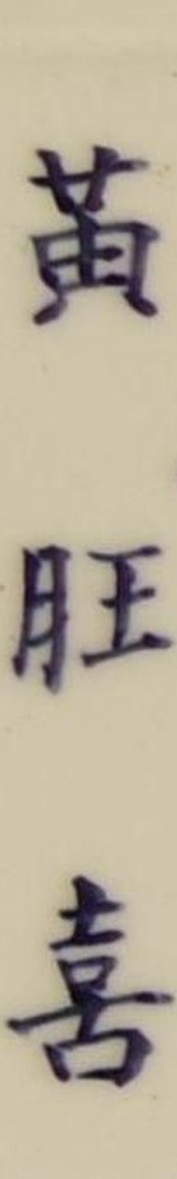黄旺喜

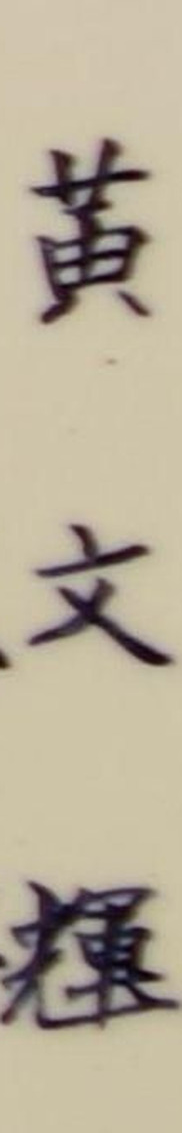黄文輝
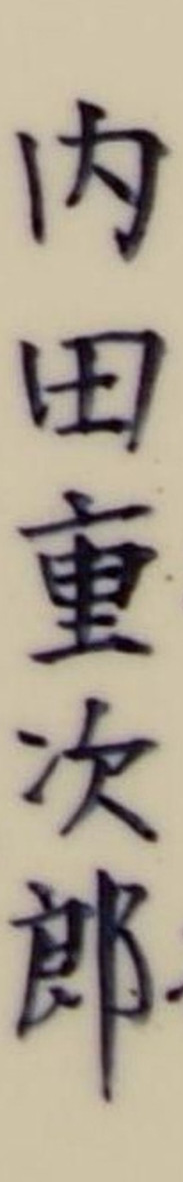内田重次郎
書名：E~L
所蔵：高野山金剛峯寺
